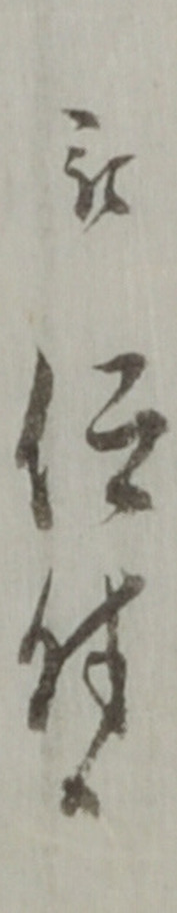被仰付候
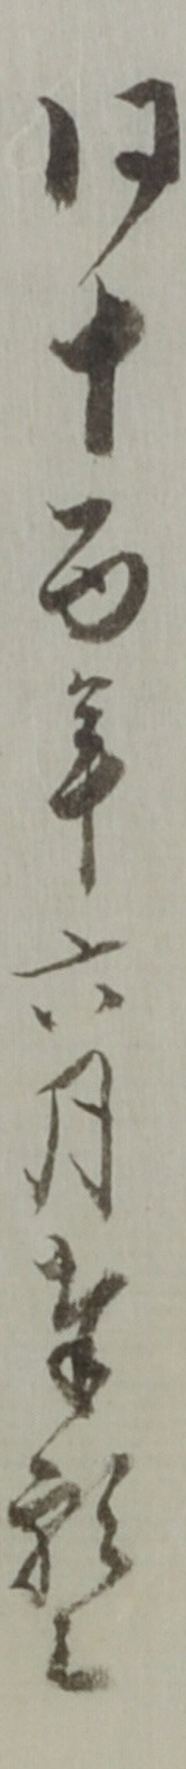同十酉年六月奉願上
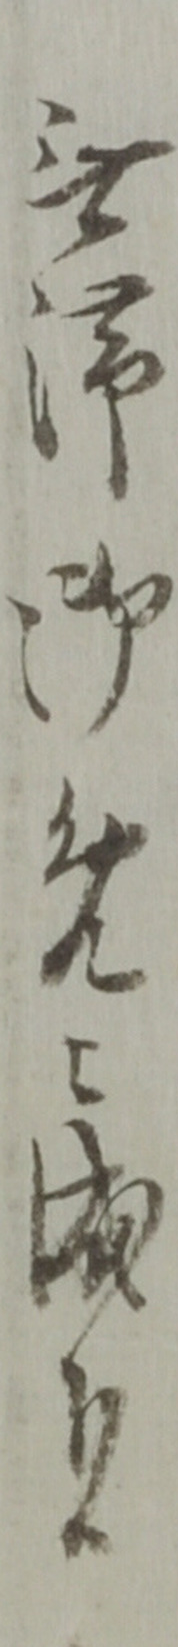無滞御免被成下候
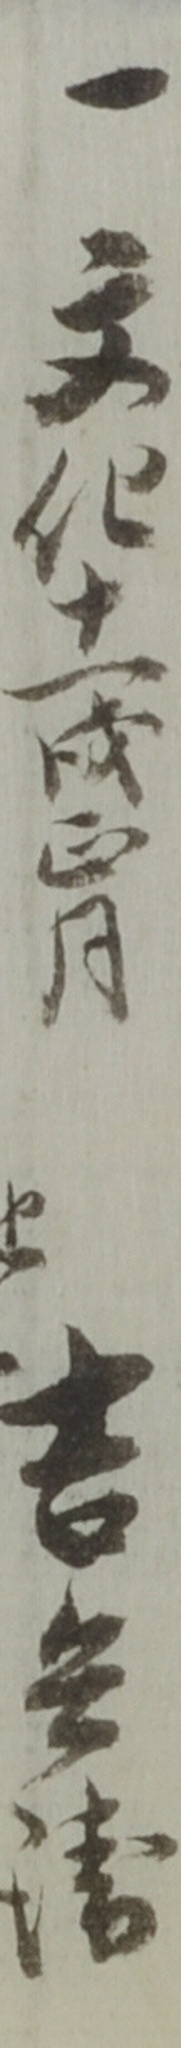一文化十一戌正月吉兵衛
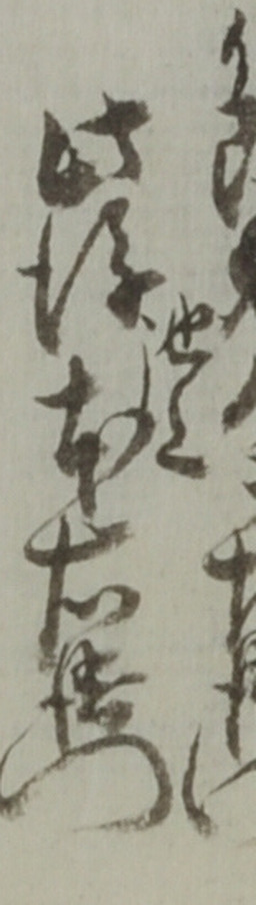此後本右衛門
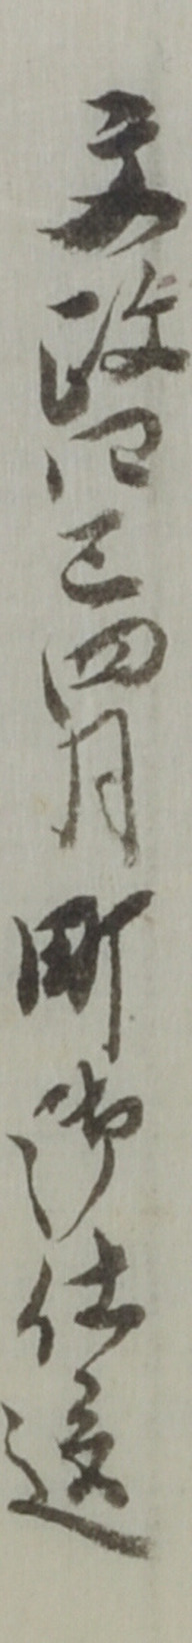文政四巳四月町御仕送
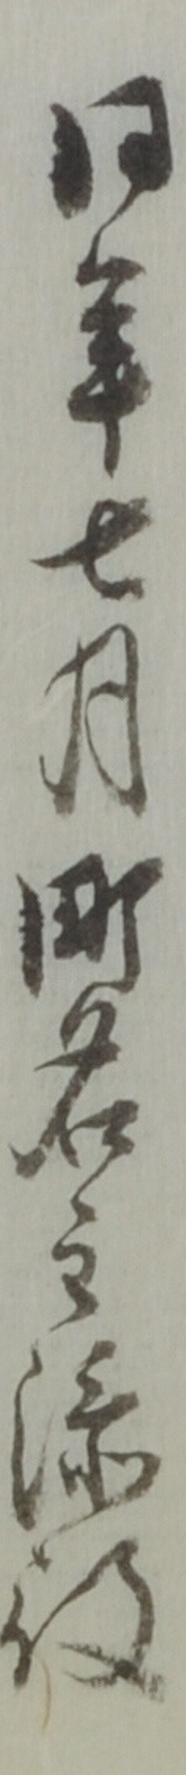同年七月町名主添役
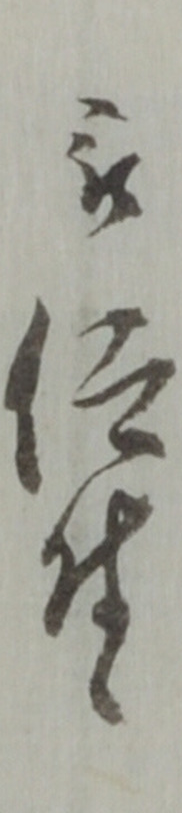被仰付候
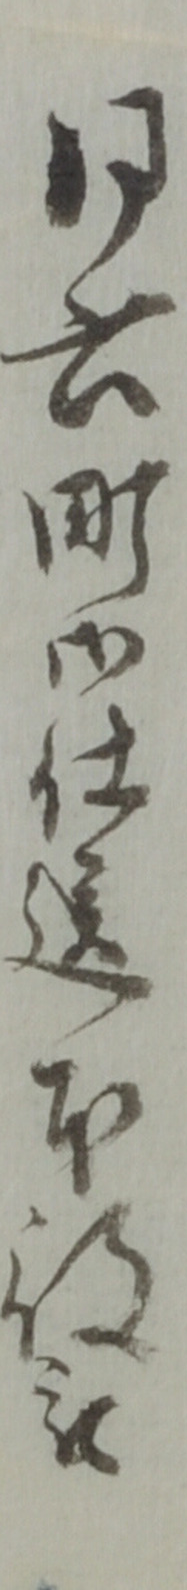同六町御仕送本役被
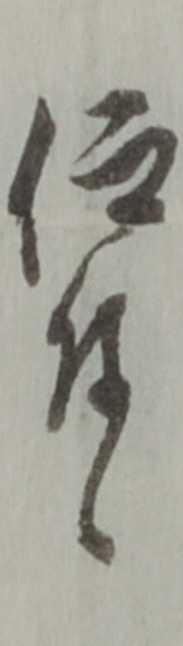仰付候
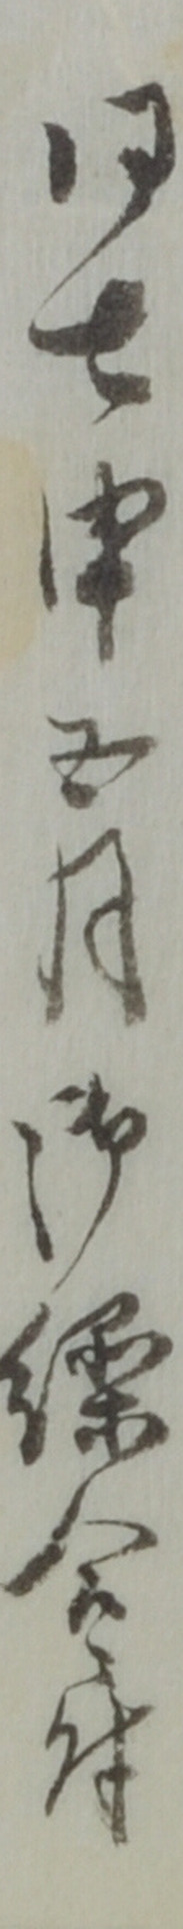同七申五月御繰合ニ付
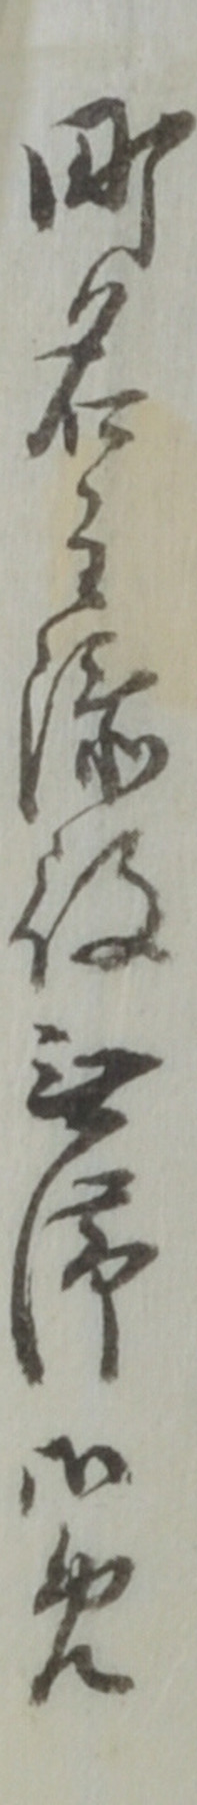町名主添役無滞御免

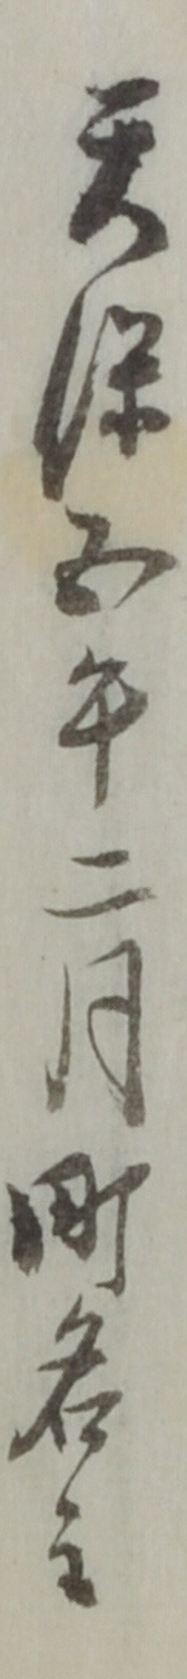天保五午二月町名主
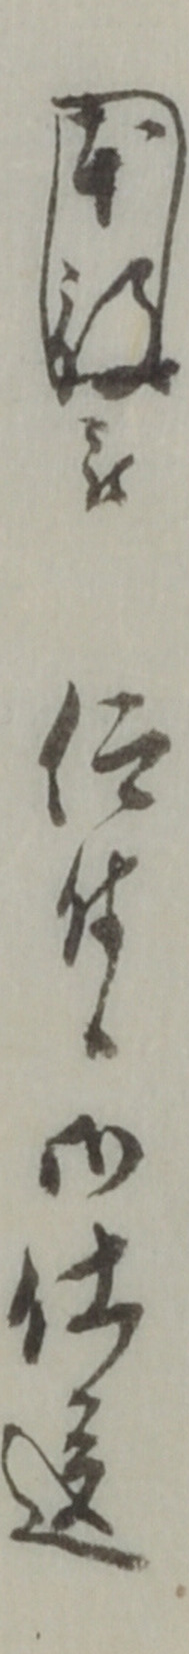本役被仰付候御仕送
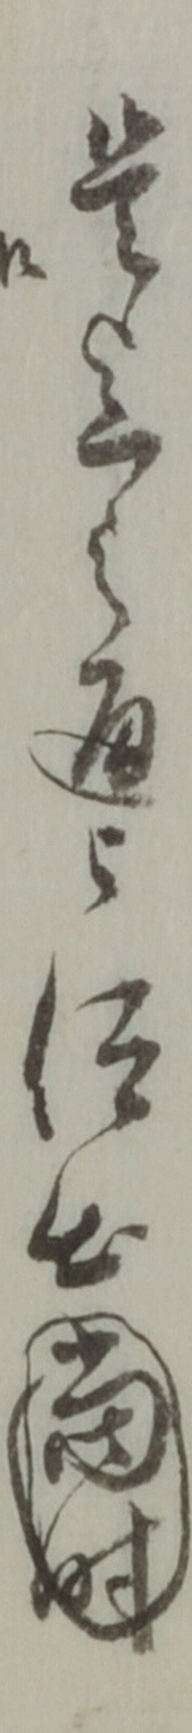是迄之通被仰出当時
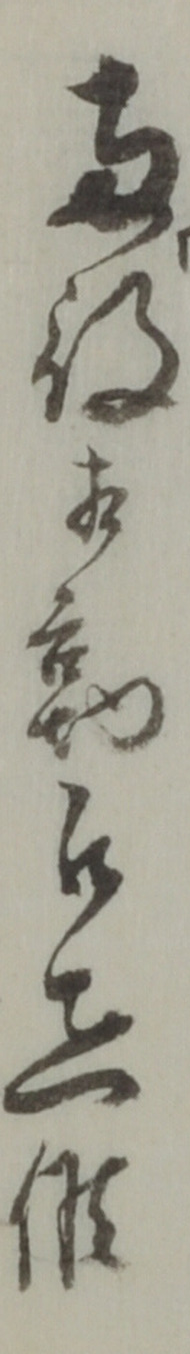両役相勤罷在候
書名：（書上）
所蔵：伊那市立高遠町図書館・合同会社AMANE
